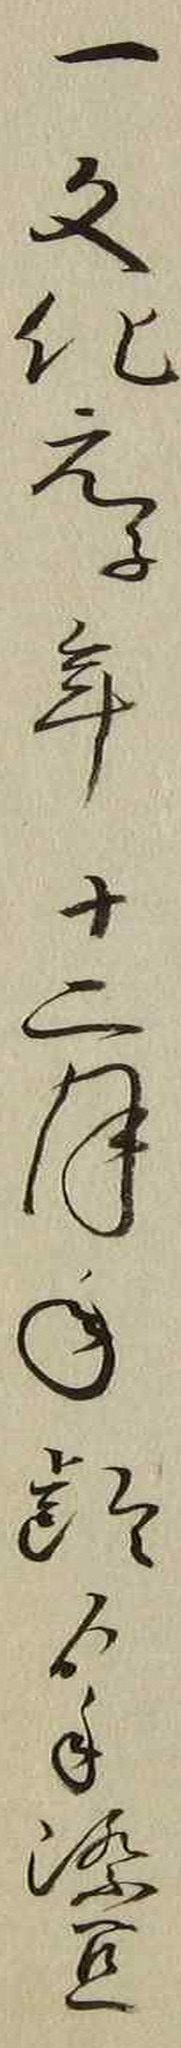一文化元子年十二月年齢ゟ手際宜
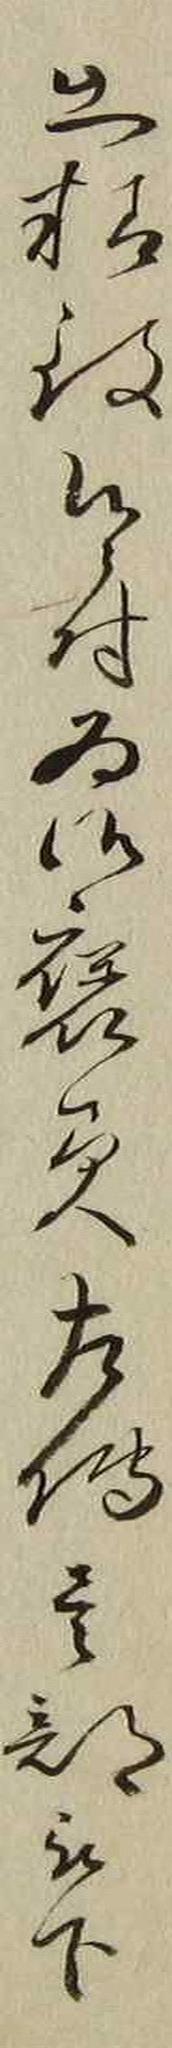出精致候ニ付為御褒美左伝壱部被下
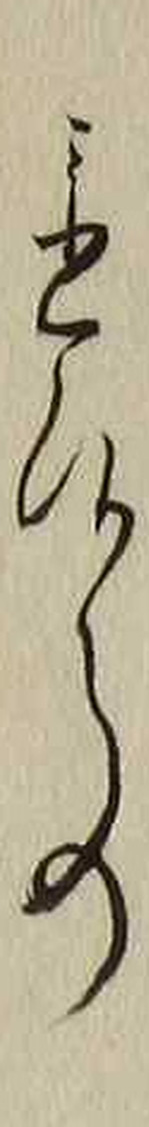置候事
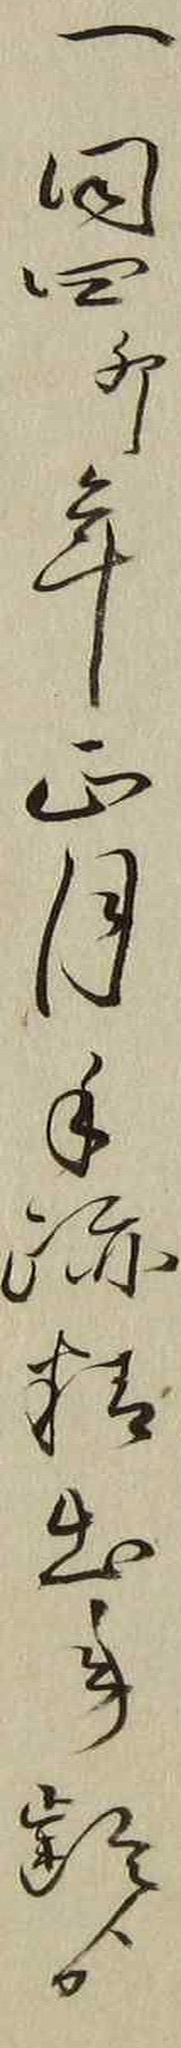一同四卯年正月手跡精出年齢ゟ
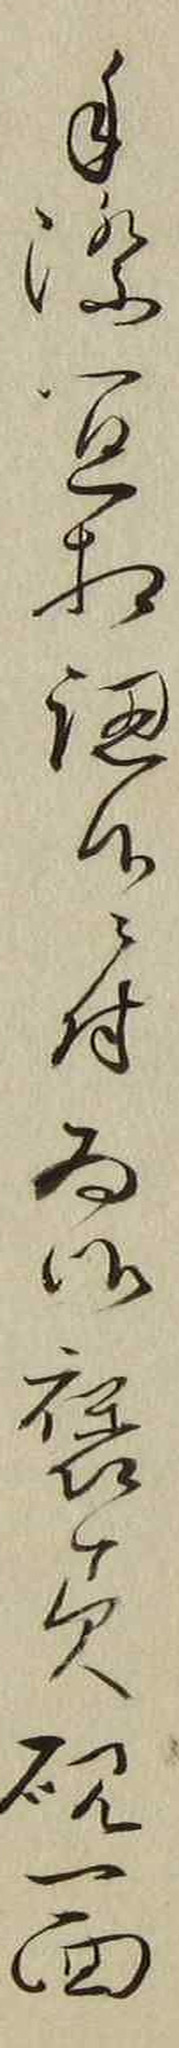手際宜相認候ニ付為御褒美硯一面
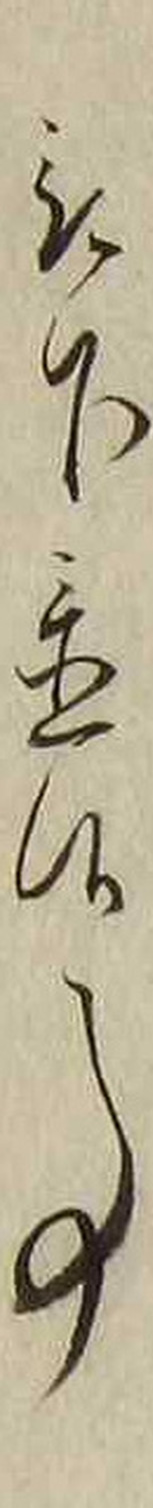被下置候事
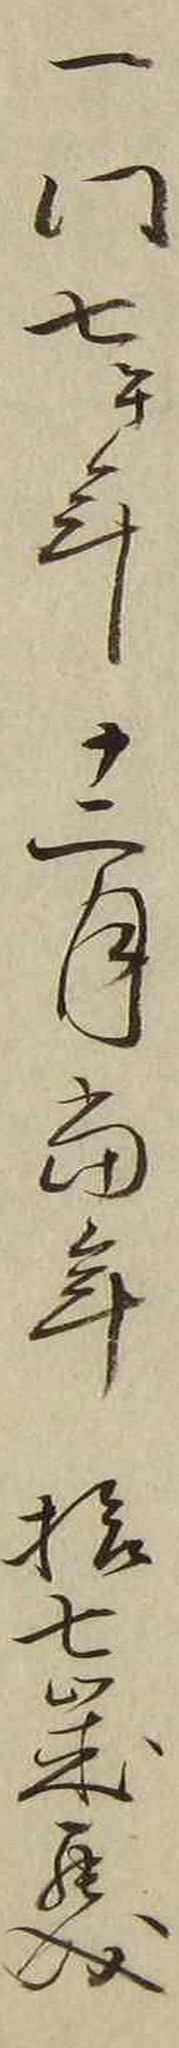一同七午年十二月当年拾七歳罷成

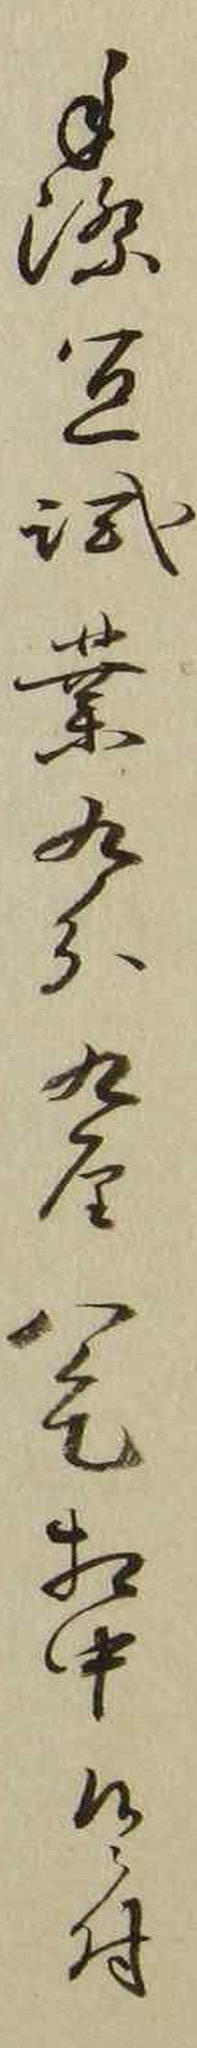手際宜試業九分九厘八毛相中候ニ付
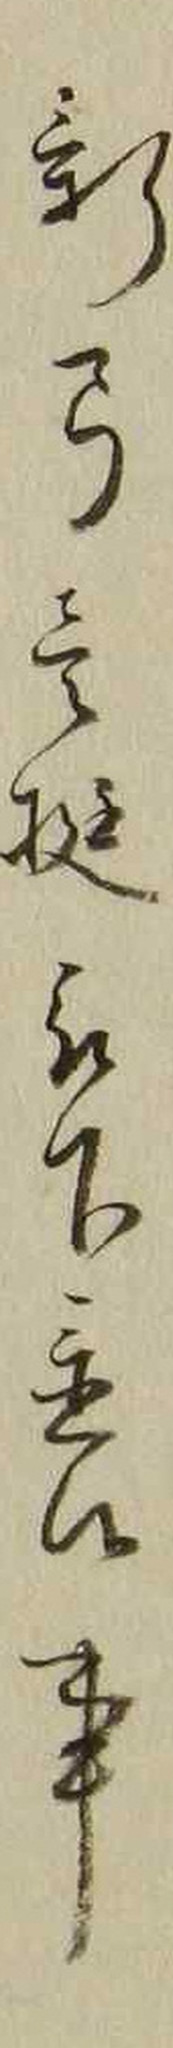新弓壱挺被下置候事
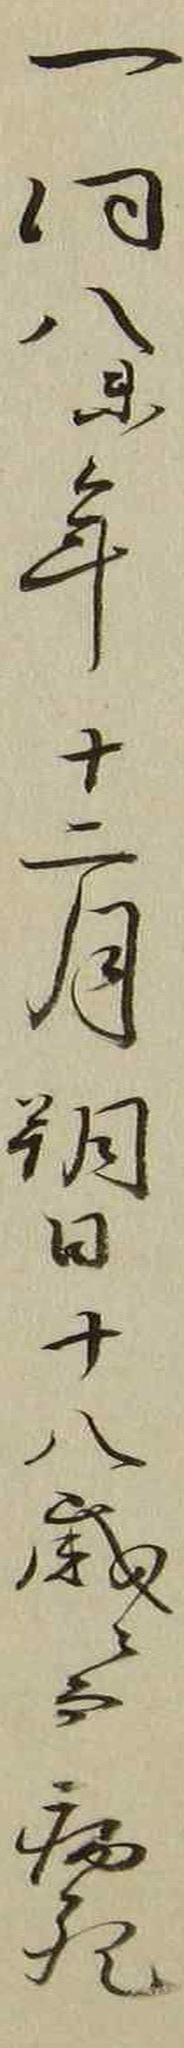一同八未年十二月朔日十八歳ニ而病死
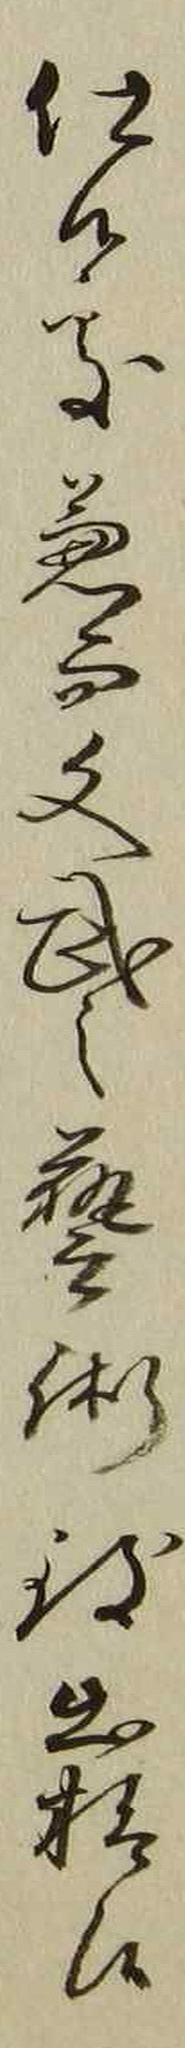仕候処兼而文武之芸術致出精候
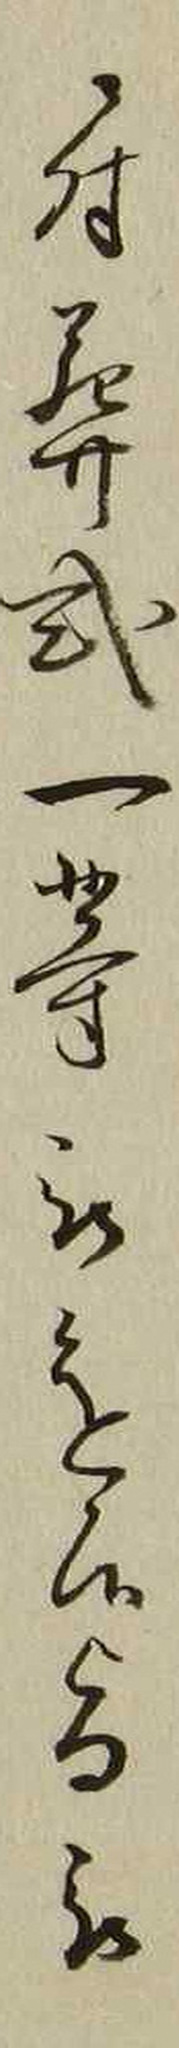ニ付葬式一等被進候旨被
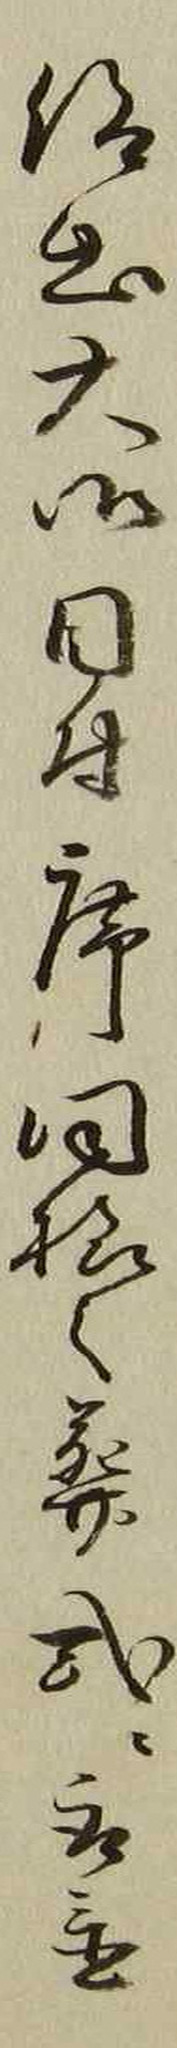仰出大御目付席同様之葬式ニ取置
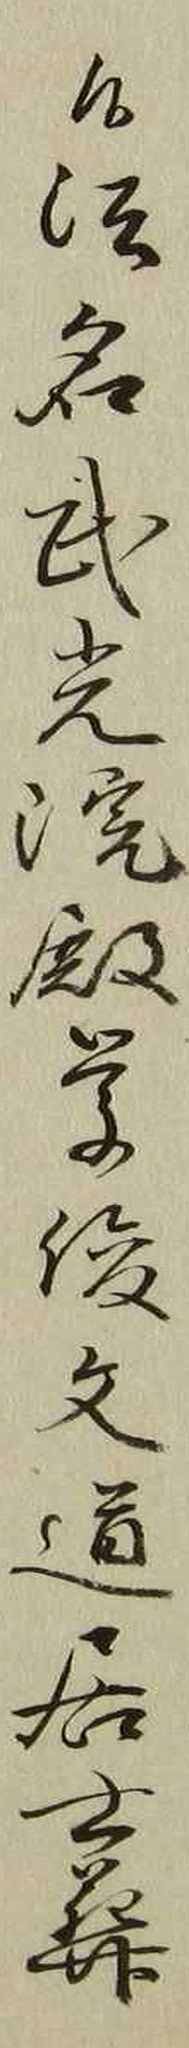候法名武光院殿学俊文道居士葬
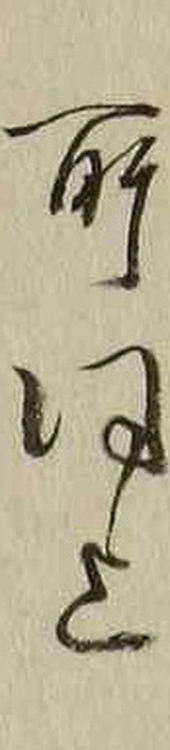所同上
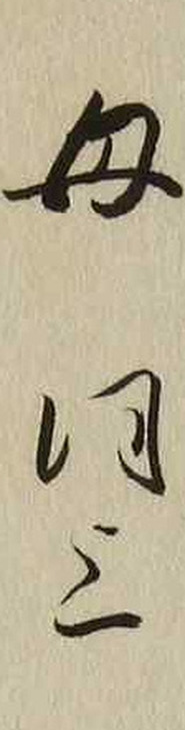母同上
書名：諸士系譜　巻之2　い之部2
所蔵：会津若松市立会津図書館
